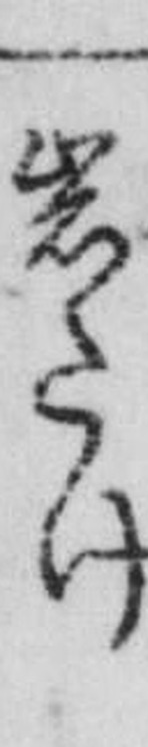岩たけ
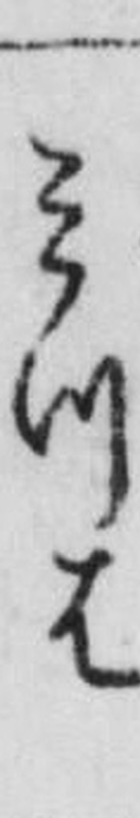みつは
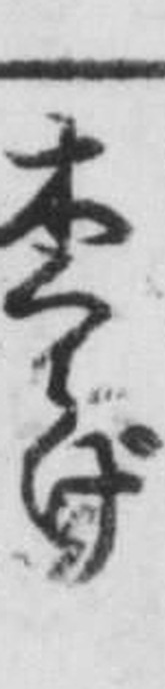木くらげ
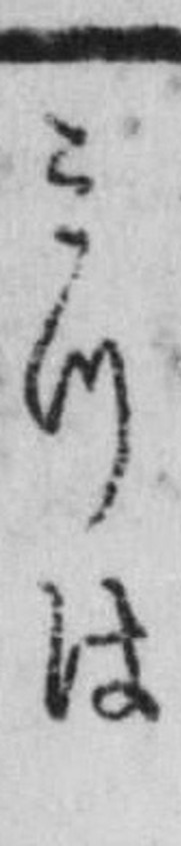みつは
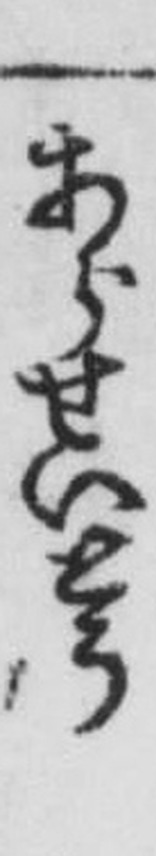あらせいとう
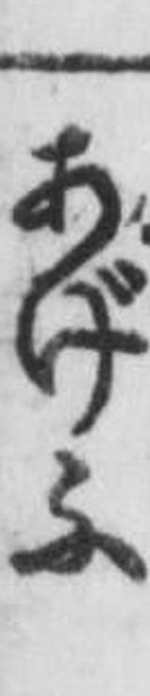あげふ
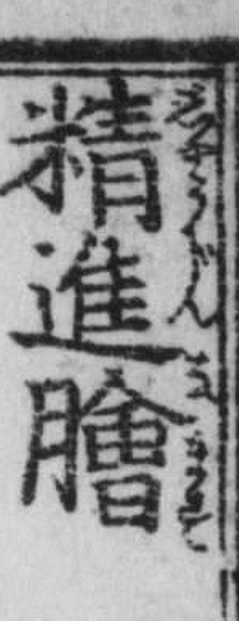精進膾
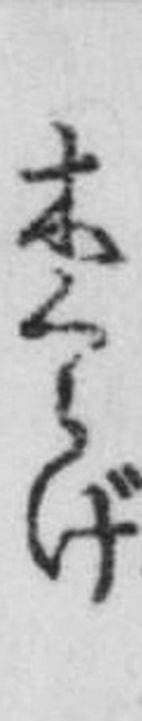木くらげ
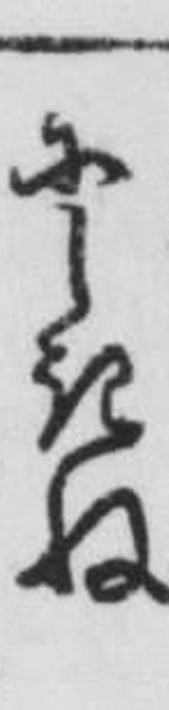にしきね
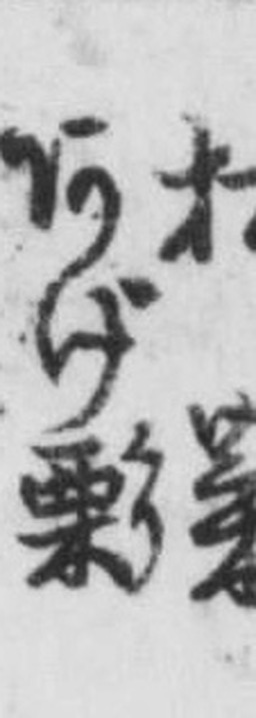あげ栗
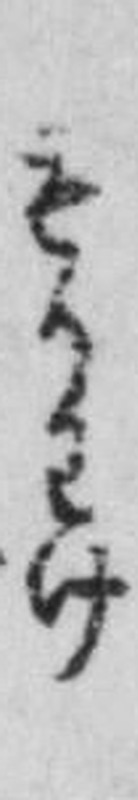もりわけ
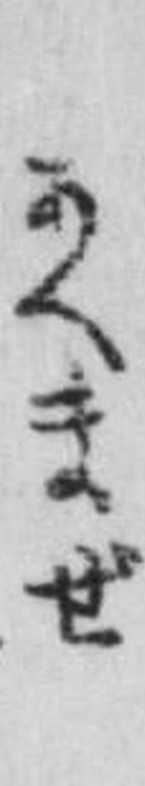あへまぜ
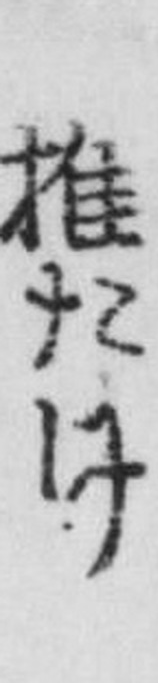椎たけ
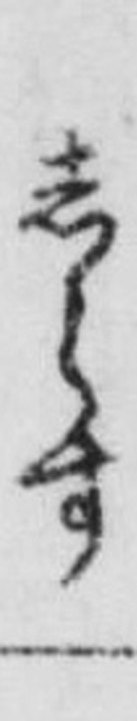しらす
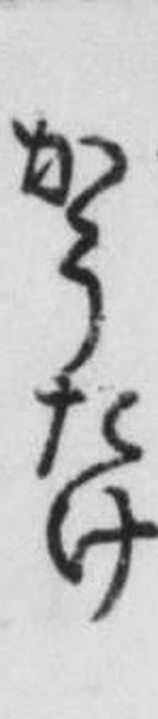かうたけ
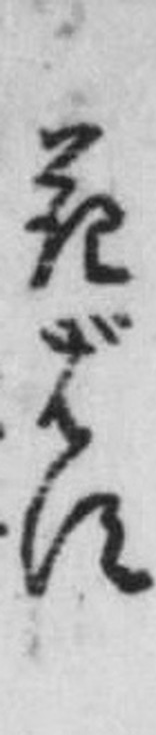花ばす
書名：精進魚類間合料理/早速庖丁
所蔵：大阪府立大学学術情報センター 国文学研究資料館
